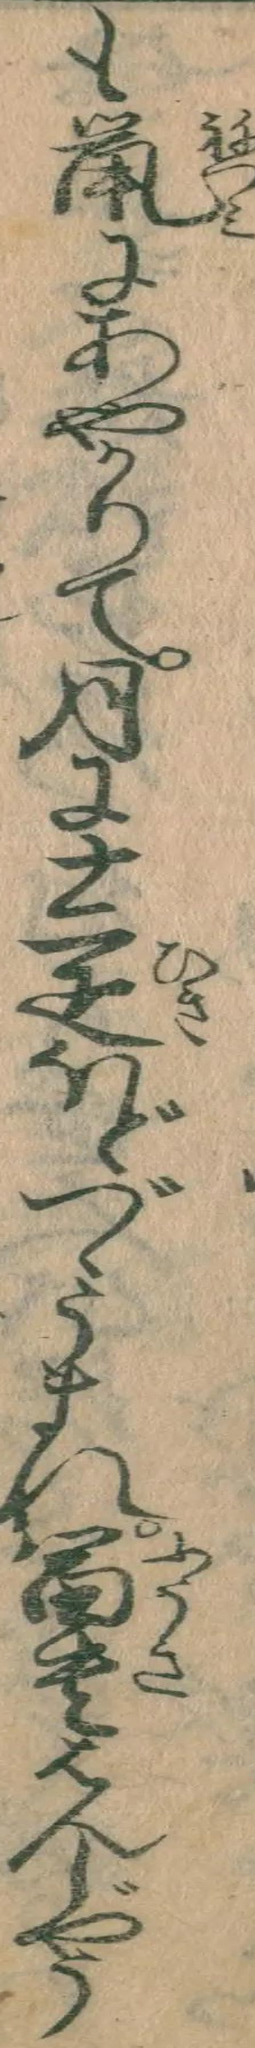も鼠にあやかりて。月に十二疋ほどづゝうまれ。富貴はんじやう
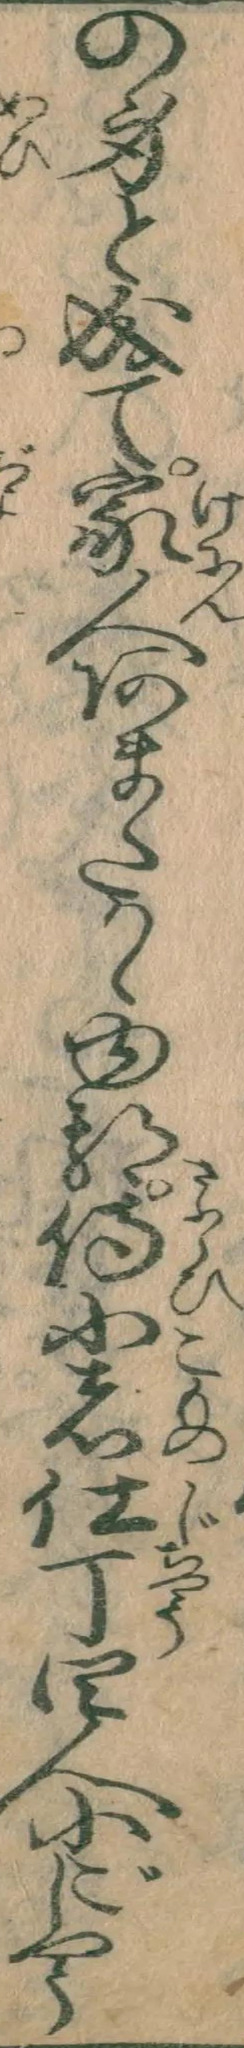の身と成て。家人あまたかゝゆる。侍小者仕丁四人小ごしやう
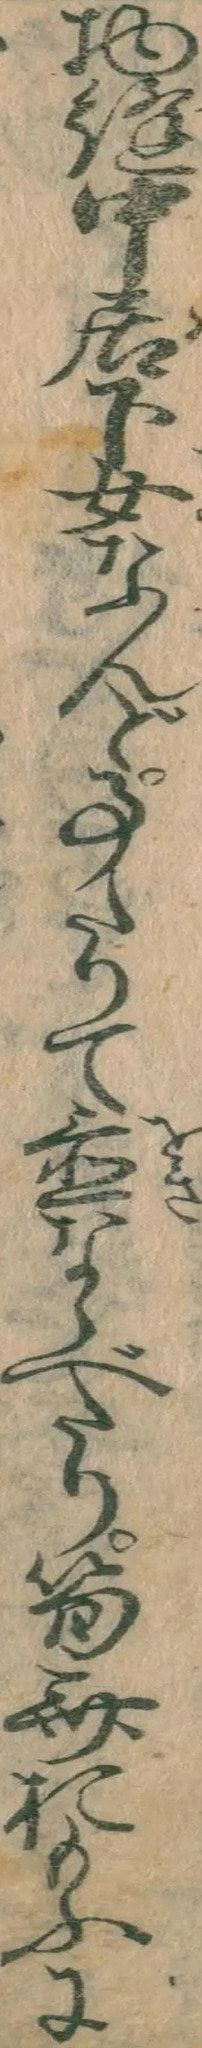物縫中居下女なんど。事たりて置ならべたり。筍斎おもふに
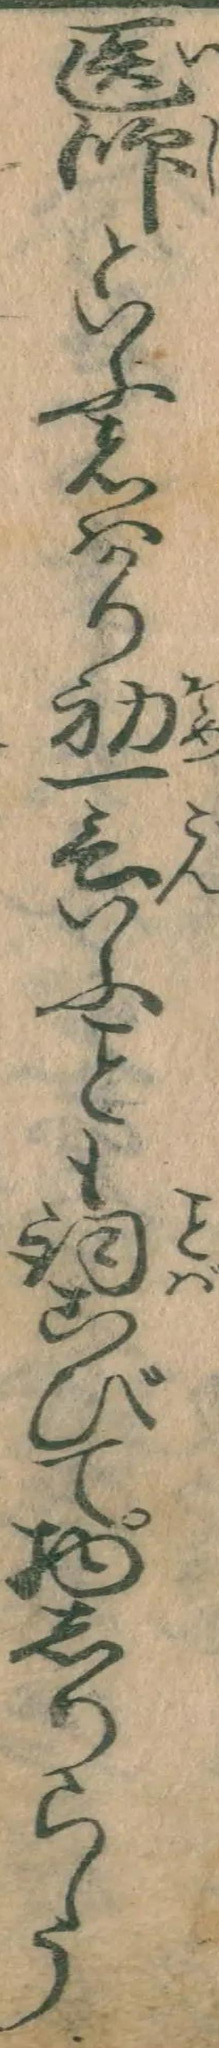医師といふ者はかり初一言いふことも詞こびて。物しりらしう
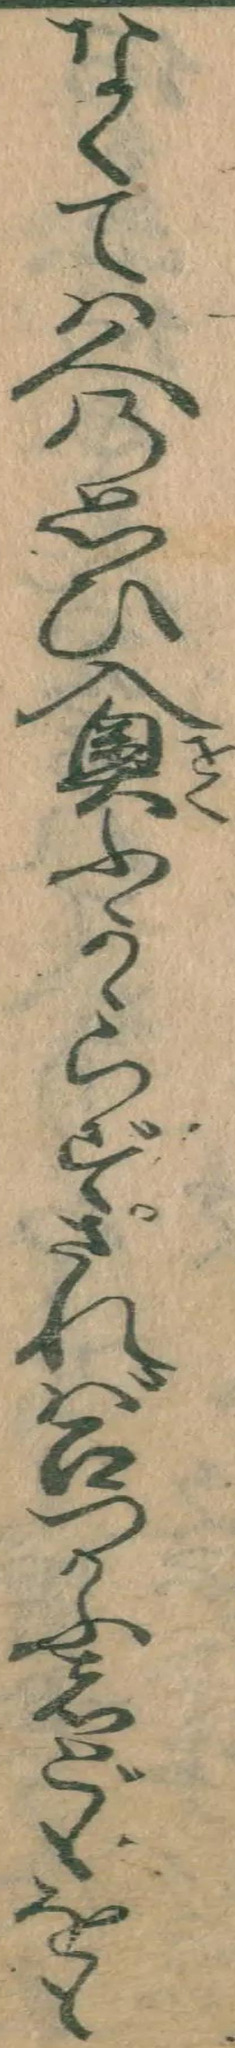なくては人の思ひ入奥ふかゝらず。されば召つかふ者どもをも

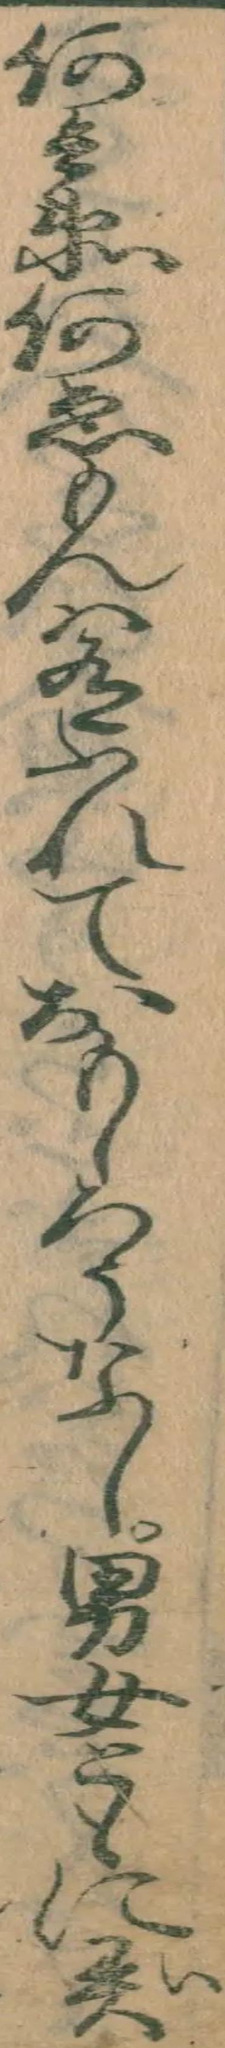何兵衛何ゑもんは有ふれておもしろうなし。男女ともに異
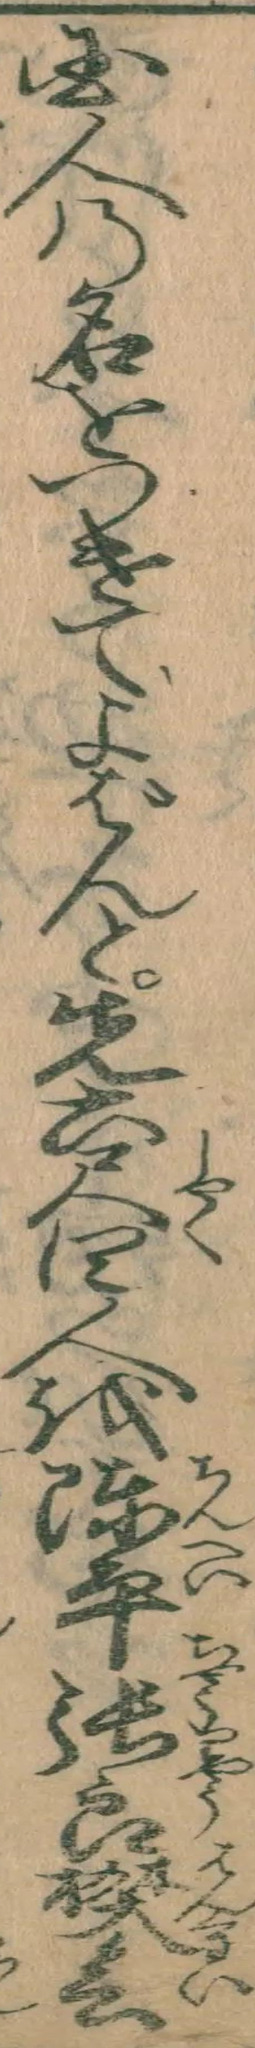国人の名をつけてよばんと。先六尺四人を陳平張良焚会
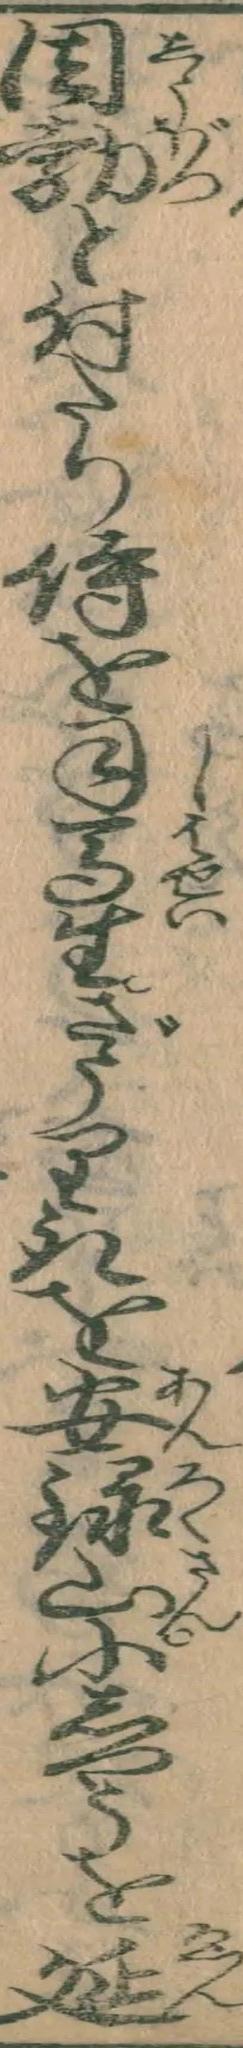周勃と付たり侍を司馬生。ざうり取を安録山。小しやうを延
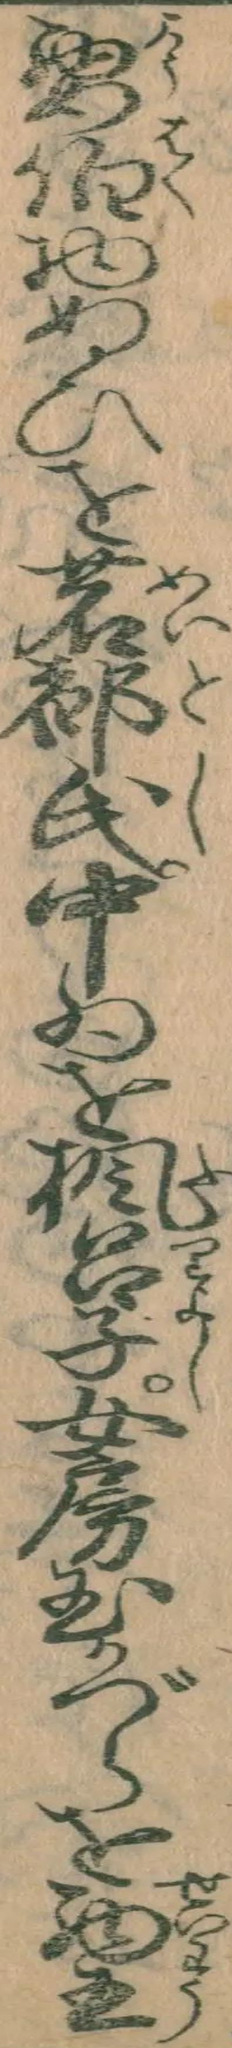要伯物ぬひを茗都氏。中ゐを楓呂子。女房玉かづらを西王
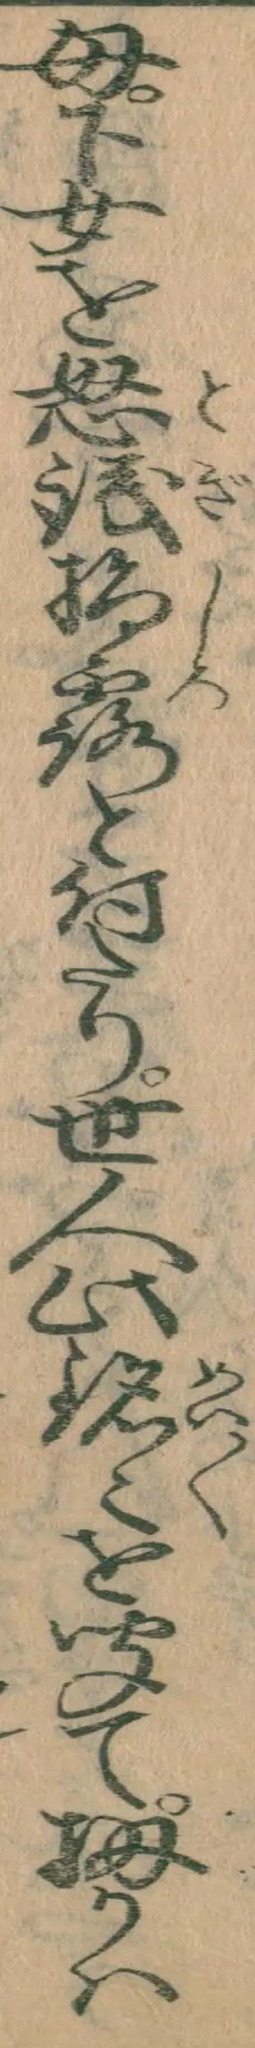母。下女を怒議指露と付たり。世人此銘々を聞て。扨かは
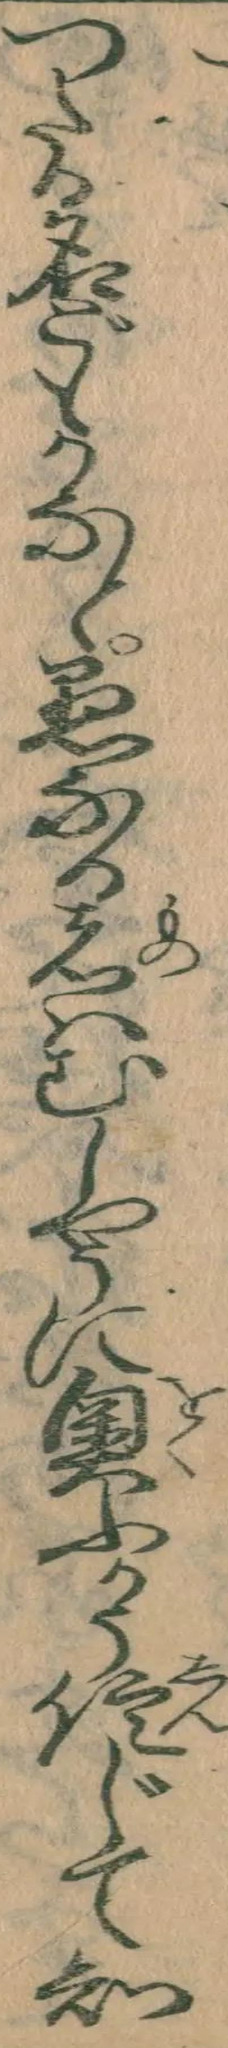つたる名どもかなと。愚なる者はむしやうに奥ふかう信じて知
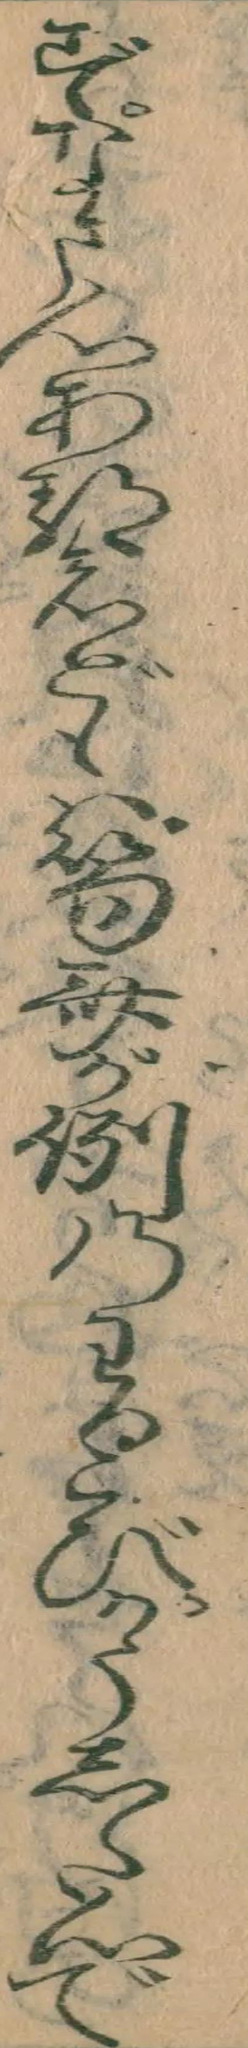ず。なま心ある者どもは筍斎が例のわるこび。かうした心で
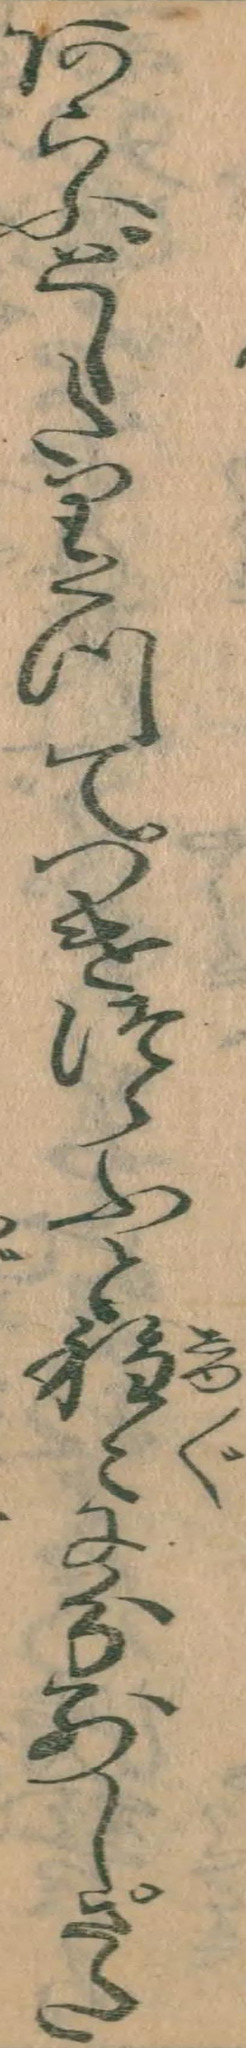あらふとしたりくつて。つけつゝふと種々に分別し。さた
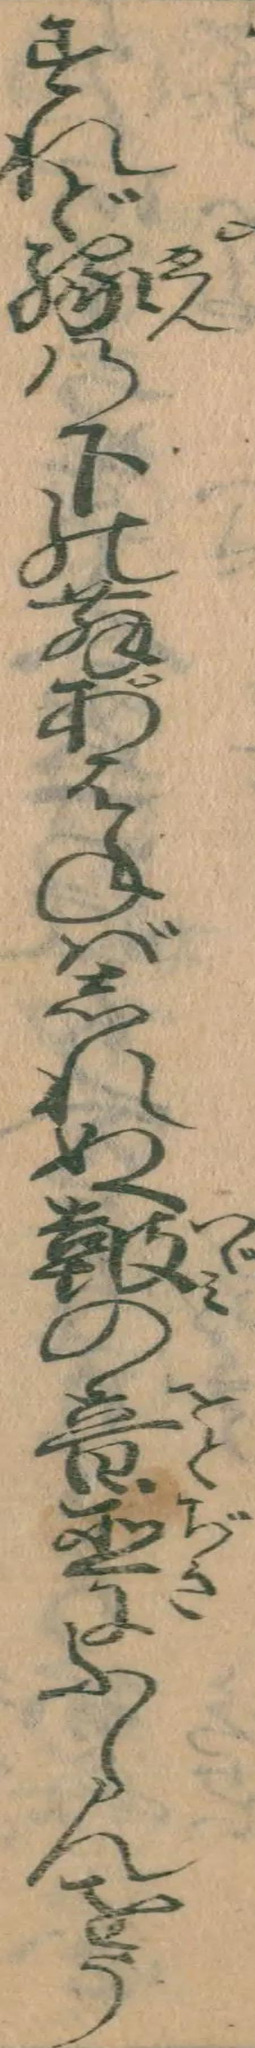すれど縁の下の舞。あはねばしれぬ鼓の音直にふしんをう
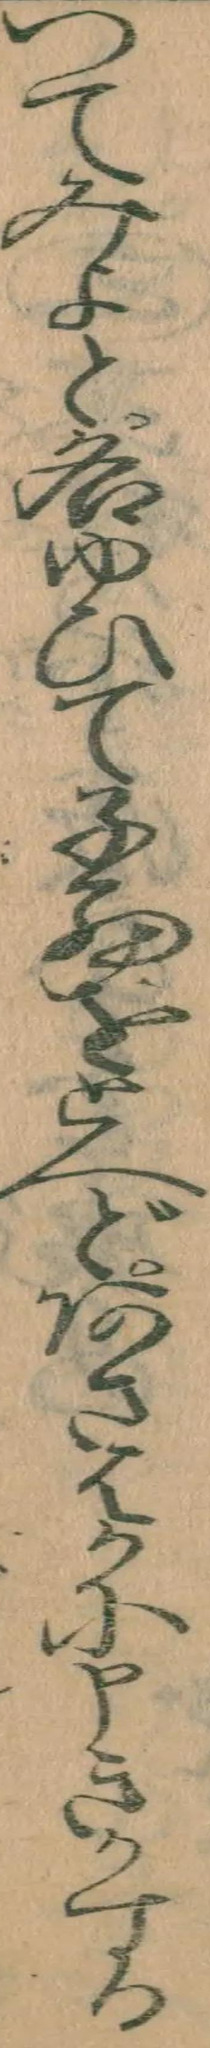つてみよと。名ゆひて子細をとへど。あさはかに申きかする
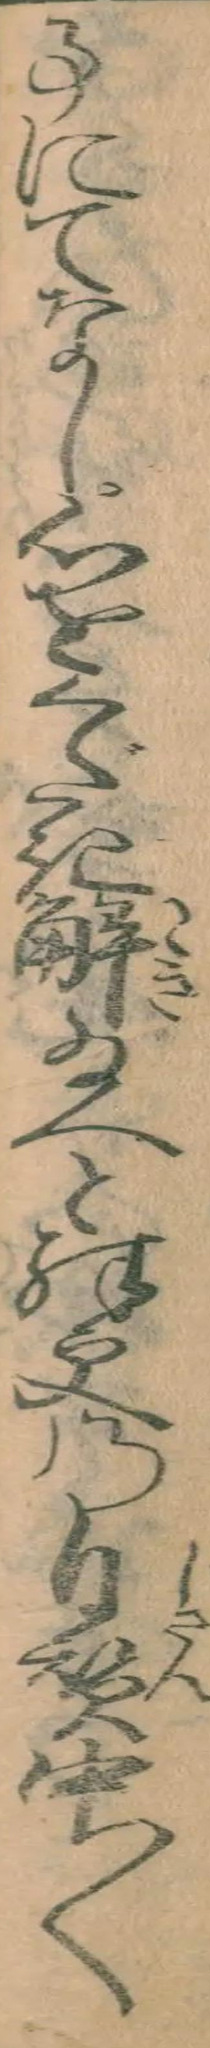事にてなし。心をくだき解給へと殊更の自賛中々
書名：新竹斎 5巻
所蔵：国立国会図書館 National Diet Library, JAPAN
